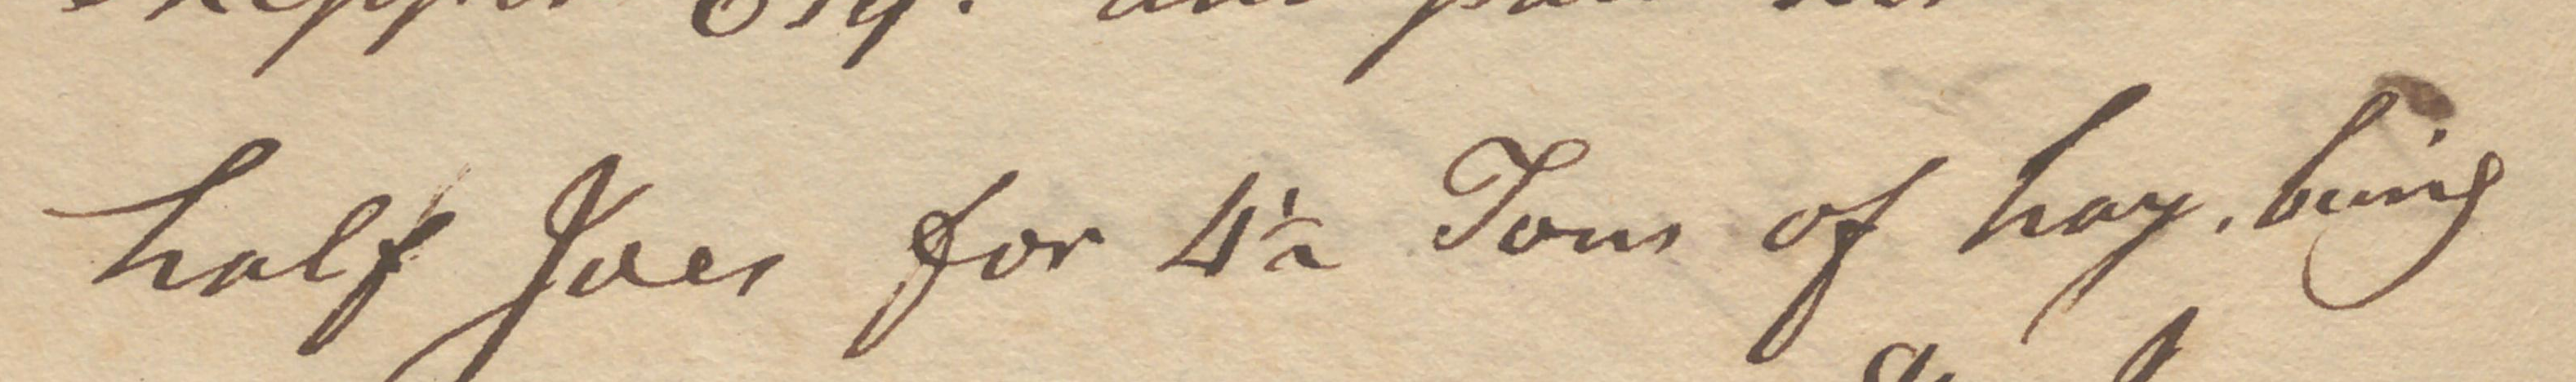half Jues for 4^2 Tons of hay, being
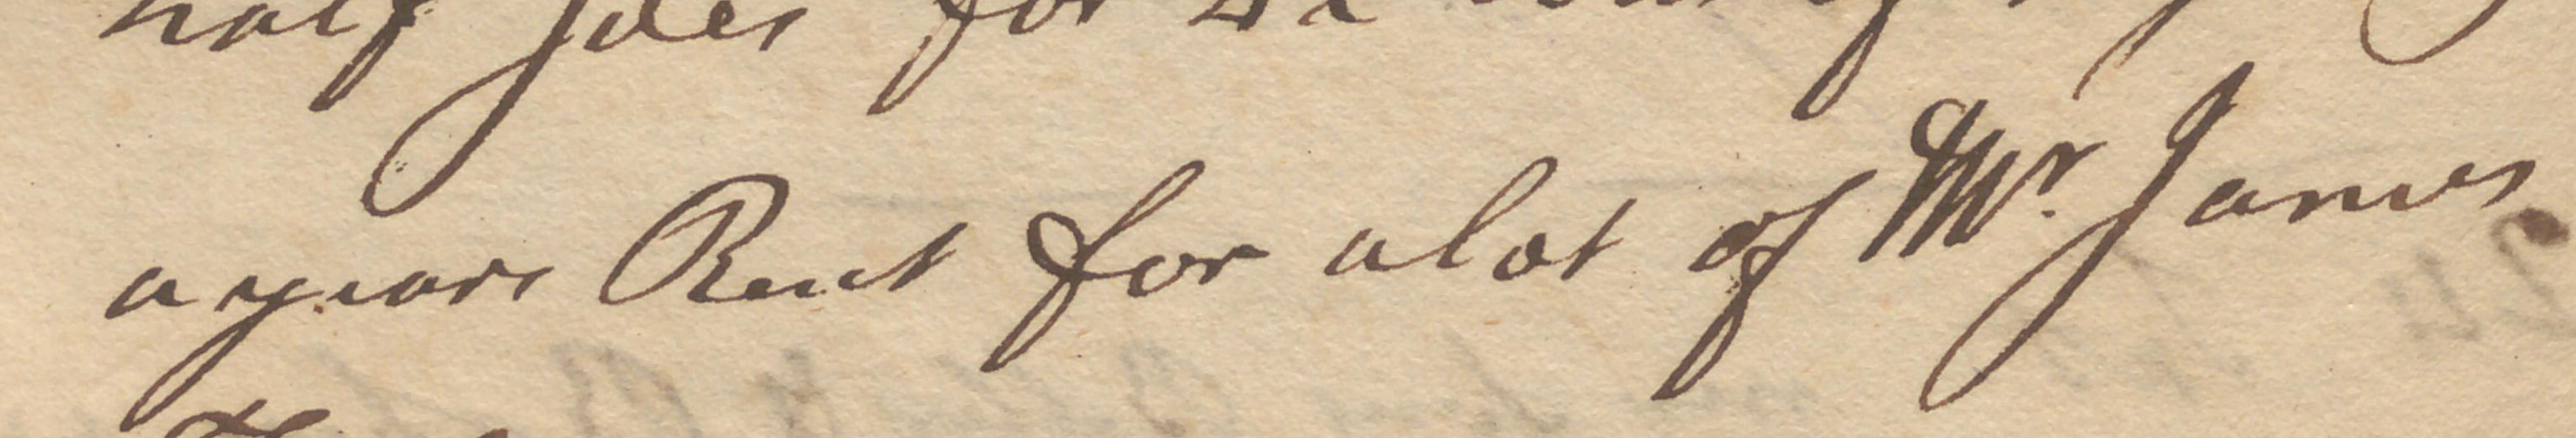a years Rent for a lot of M^r. James
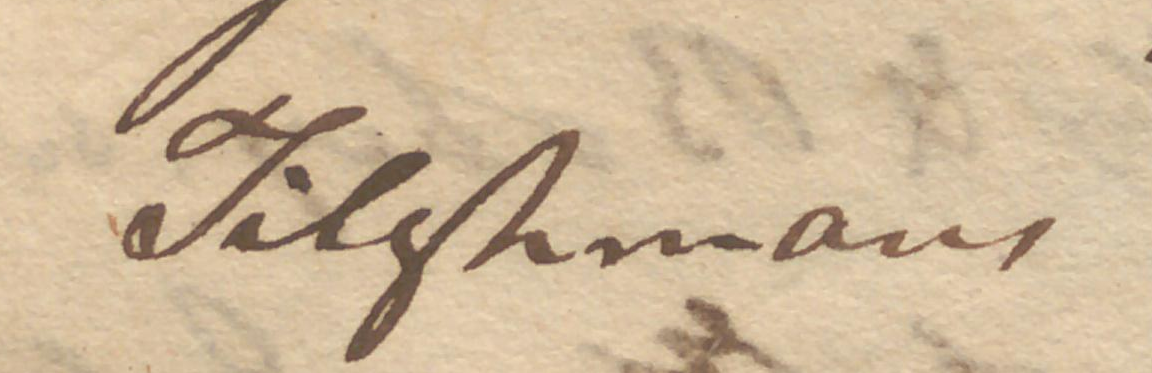Tilghmans
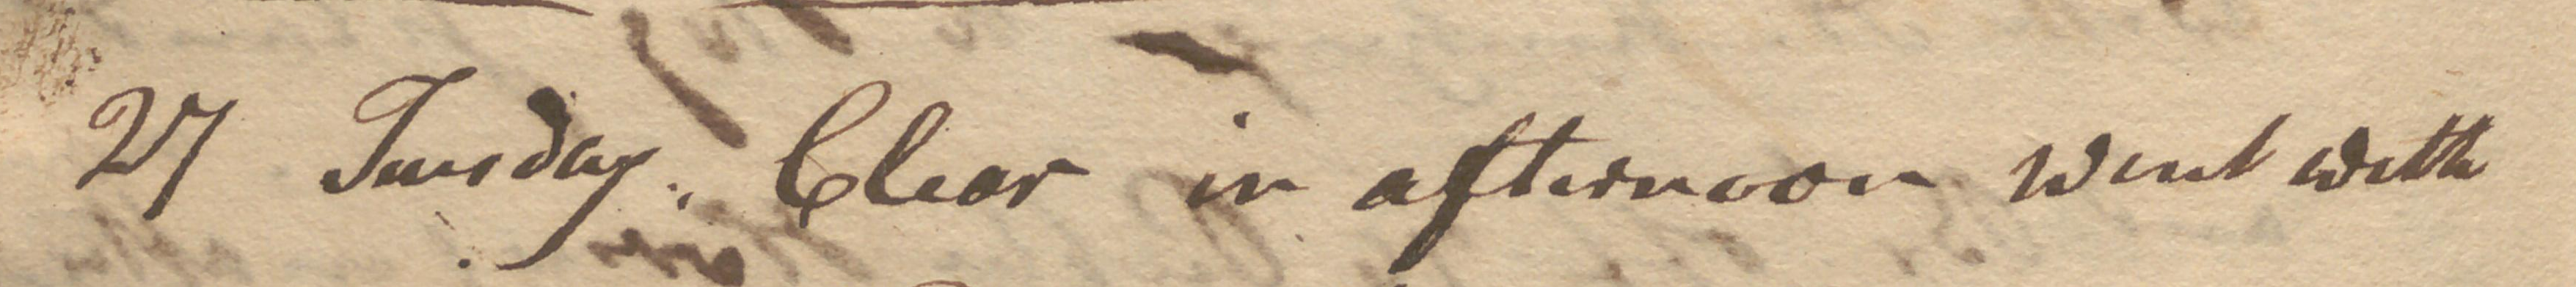27 Tuesday. Clear in afternoon went with
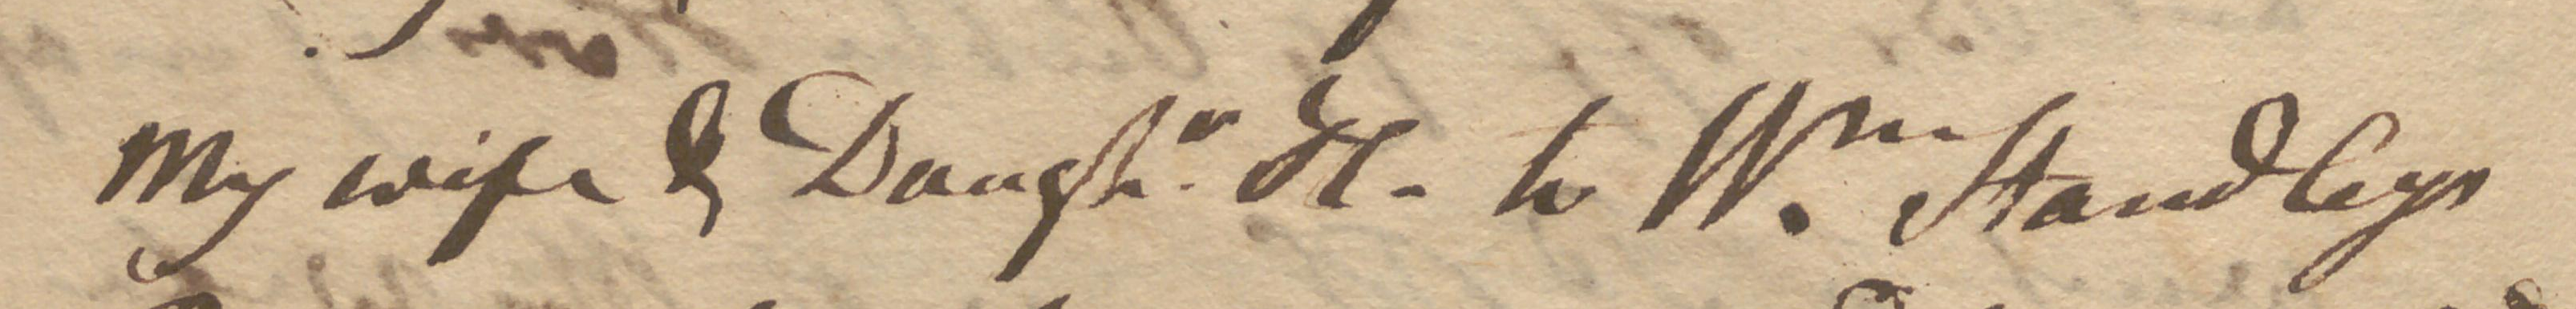My wife & Daugh^r. H. to W^m. Handleys
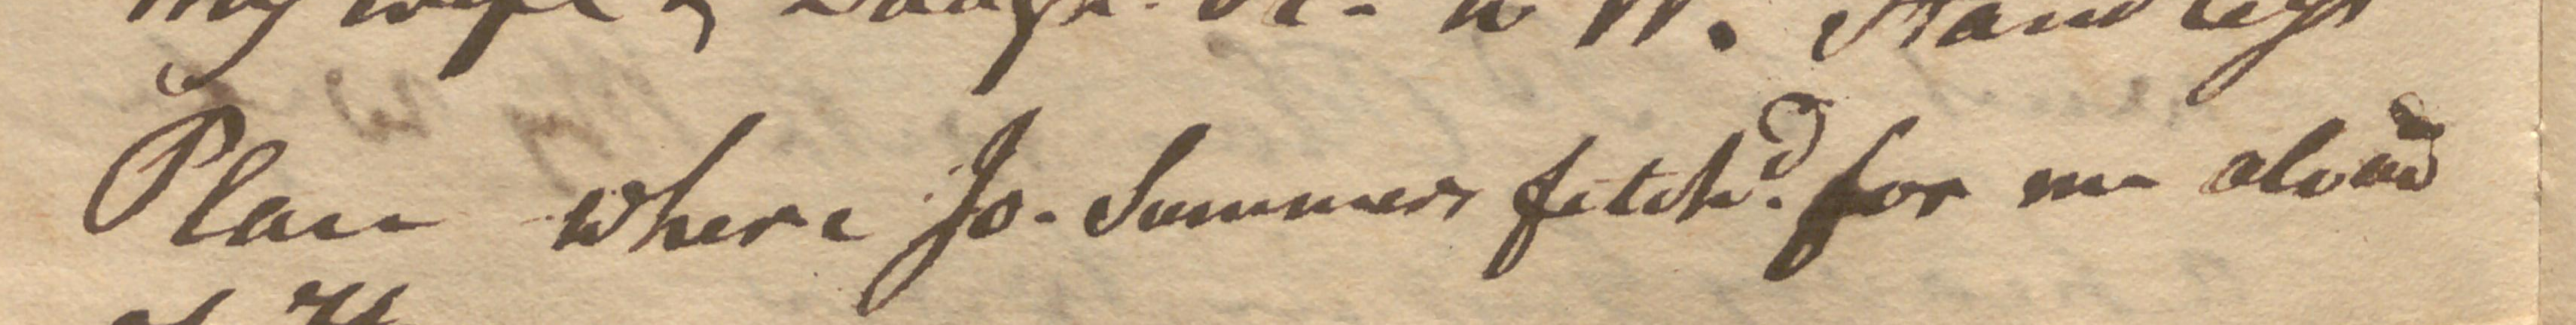Plan where Jo. Summers fetch^d. for one a load
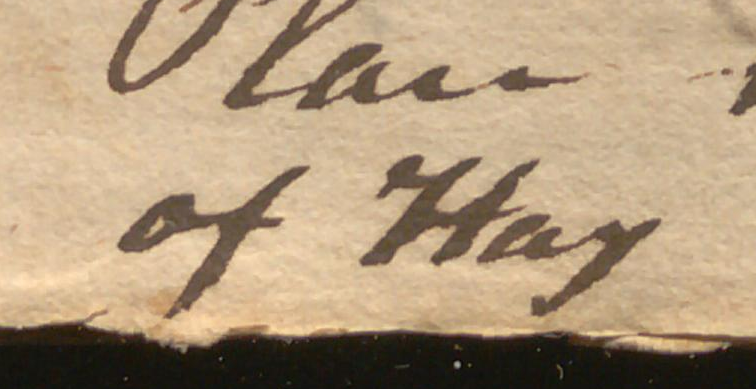of Hay
